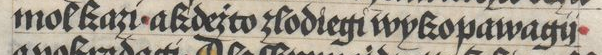mol kazí.Akdeżto zlodiegi wykopawagij.
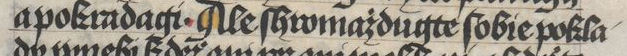a pokradagí.Ale ſhromażdugte ſobie pokla¬
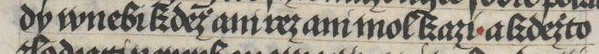dy wnebi kdeż ani rez ani mol kazí.akdeżto
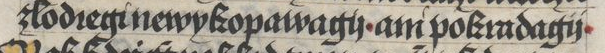zlodiegi newykopawagij.ani pokradagij.
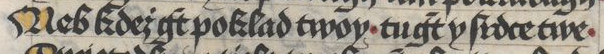Neb kdeż ḡt poklad twoy.tu ḡt y ſrdce twe.
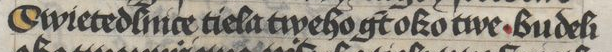Swietedlnice tiela tweho ḡt oko twe.budeli
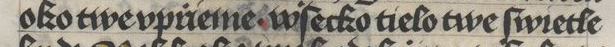oko twe vpṙíeme.wẛecko tielo twe ſwietle
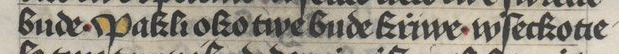bude.Pakli oko twe bude kṙiwe.wẛecko tie¬
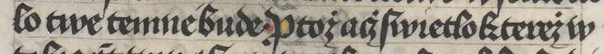lo twe temné bude.Ꝓtoż acż ſwietlo ktrereż w
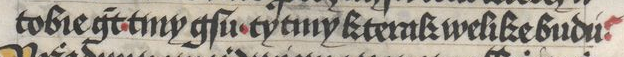tobie ḡt. tmy gſu.ty tmy kterak welike budú?
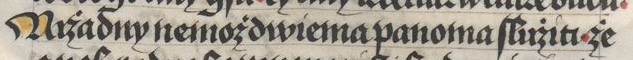Niżadny nemoż dwiema panoma ſlużiti.że
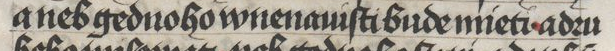a neb gednoho wnenauiſti bude míeti.a dru¬
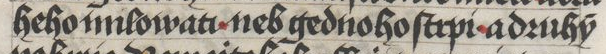heho milowati.neb gednoho ſtrpí.a druhȳ
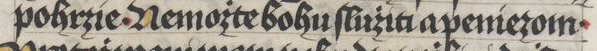pohrzíe.Nemożte bohu ſlużiti a peníezom.
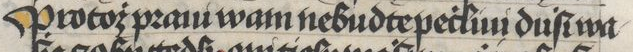Protoż przaui wam nebudte peċliui duẛi wa¬
